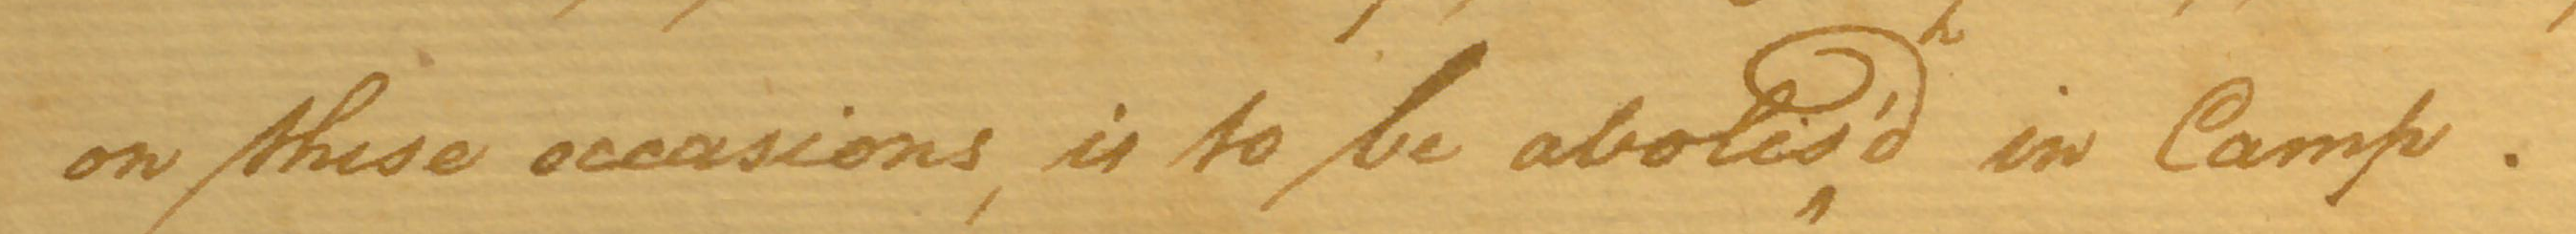on these occasions, is to be abolis^h'd in Camp.
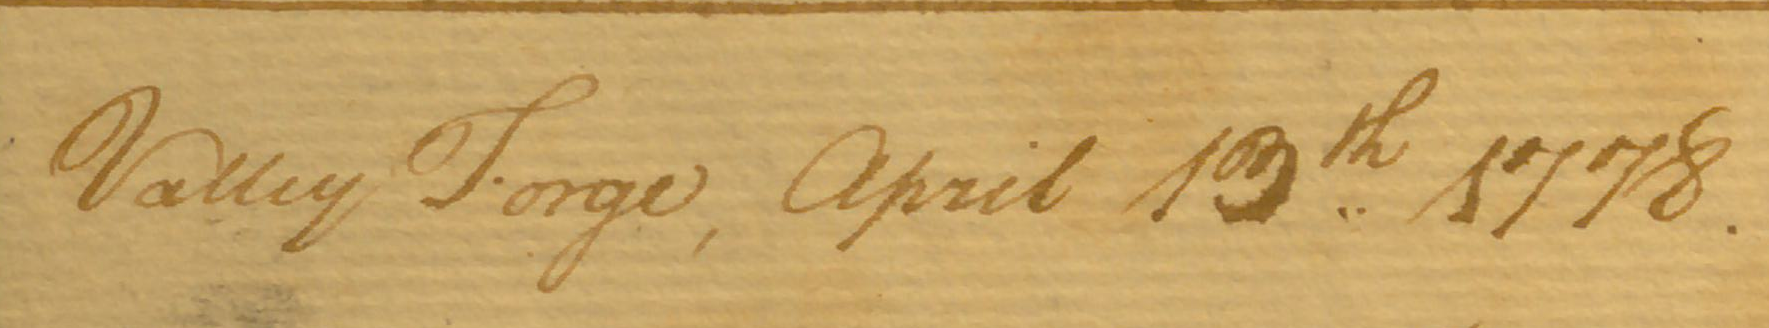Valley Forge, April 13^th. 1778.
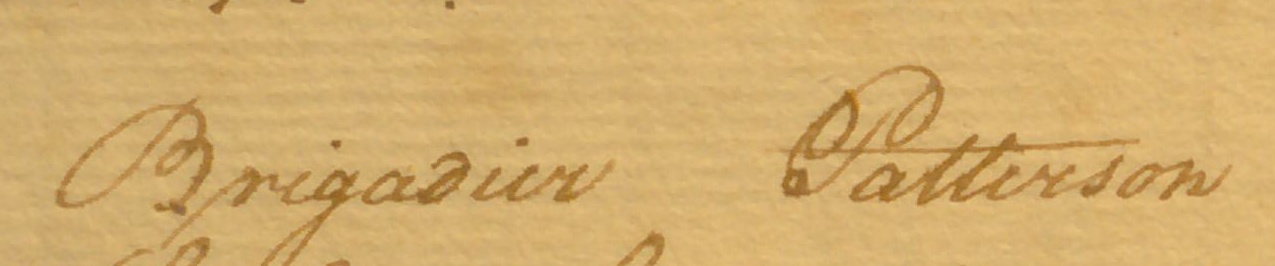Brigadier Patterson
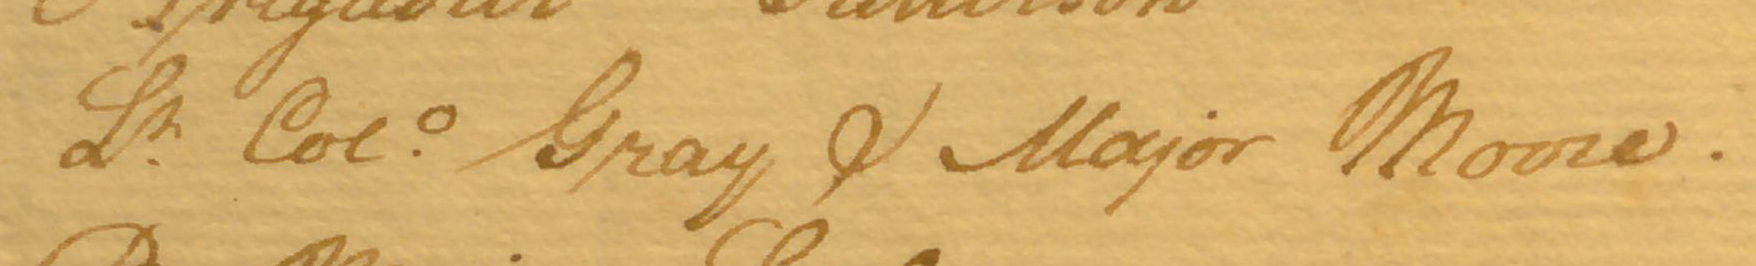L^t. Col^o. Gray & Major Moore.
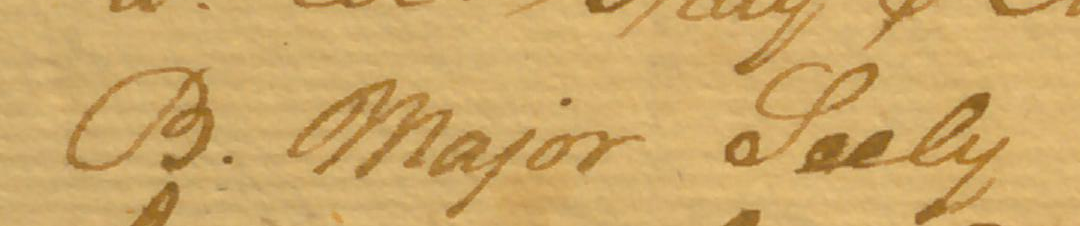B. Major Seely
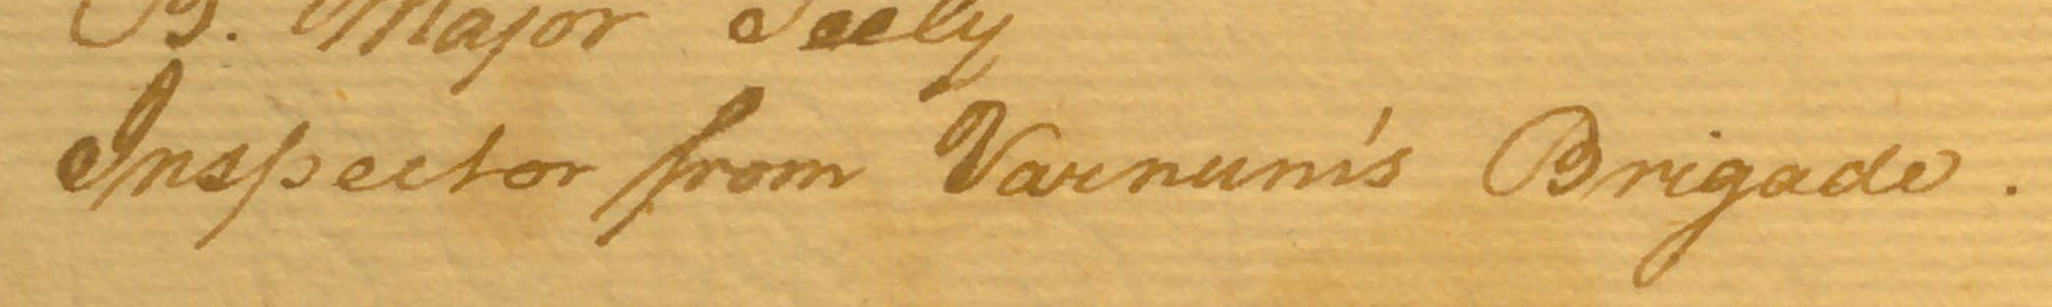Inspector from Varnum's Brigade.
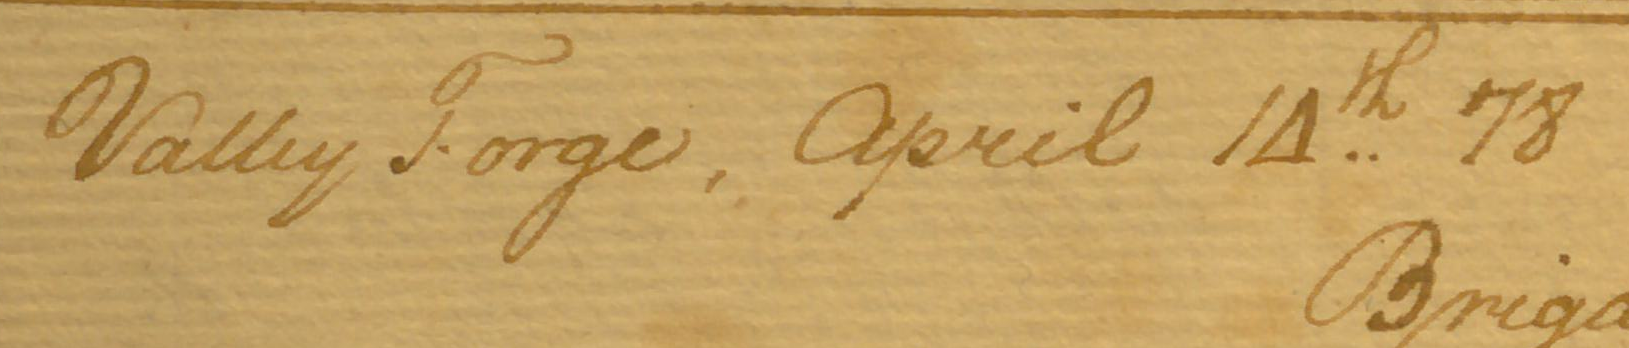Valley Forge, April 14^th. 78
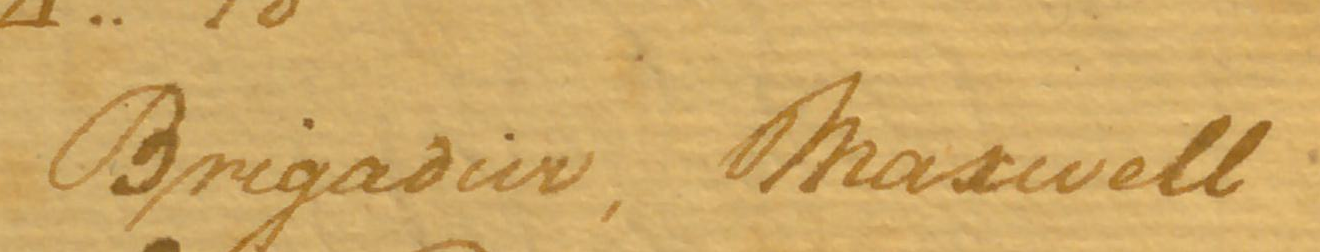Brigadier, Maxwell
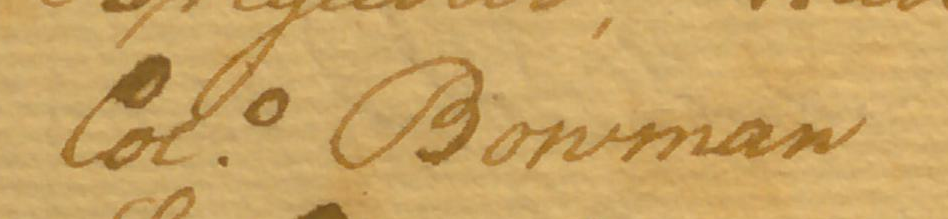Col^o. Bowman
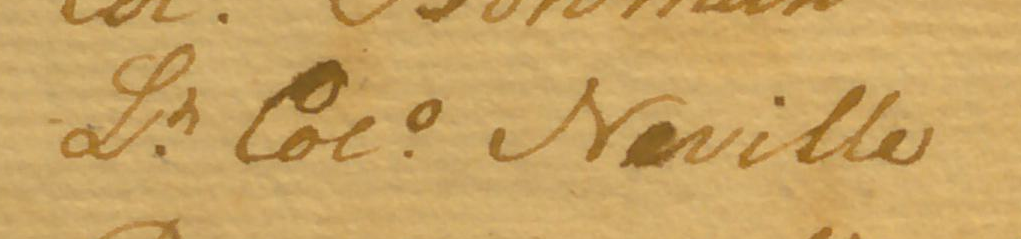L^t. Col^o. Neville
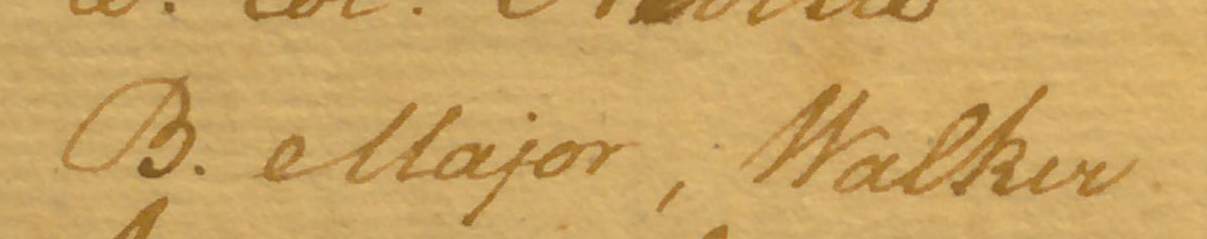B. Major, Walker
